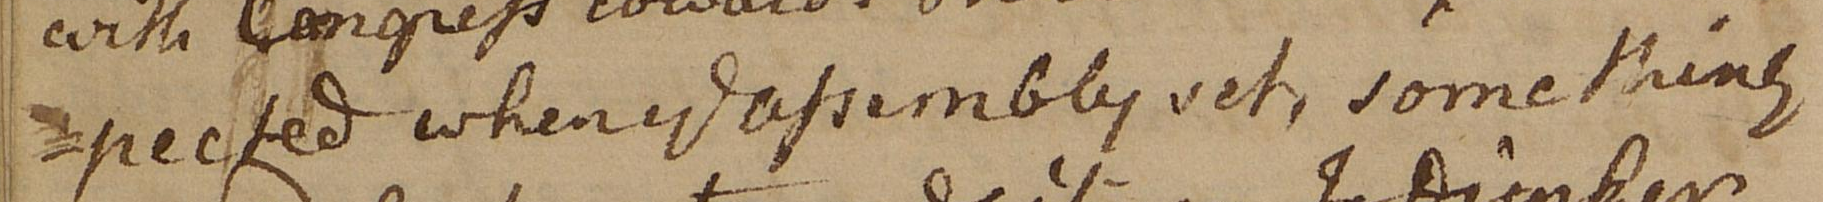-pected when y^e assembly set, something
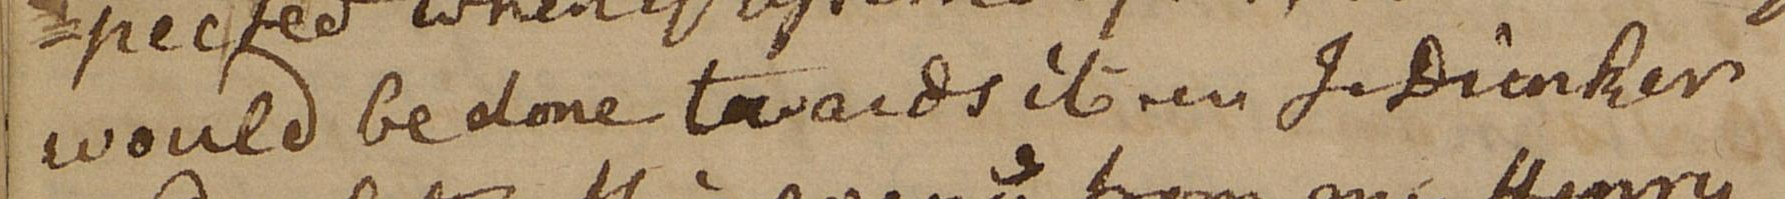would be done towards it- J. Drinker
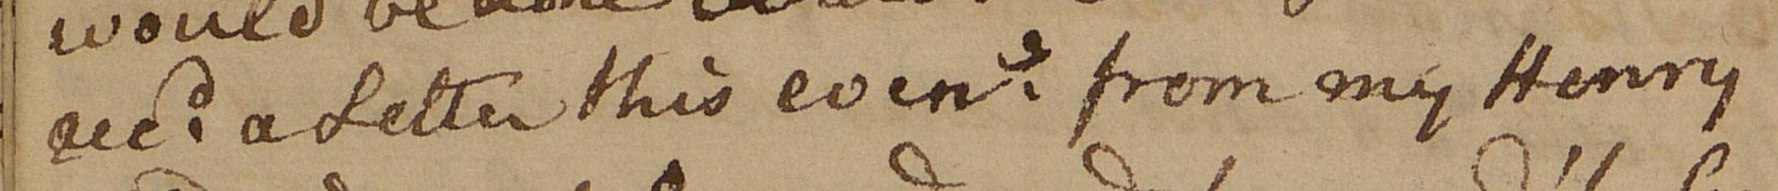rec^d. a Letter this even^g. from my Henry
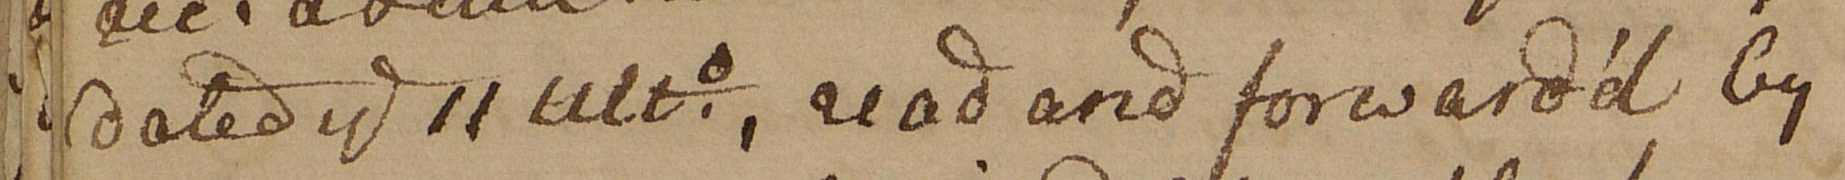dated y^e 11 Ult^o, read and forward'd by
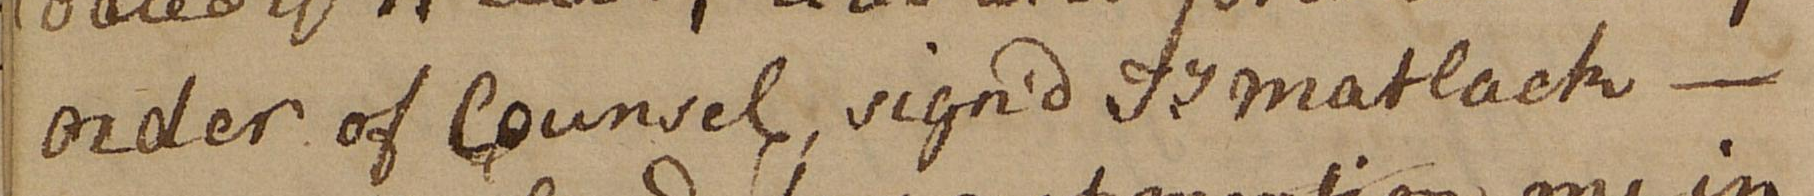order of Counsel, sign'd T^y. Matlack-
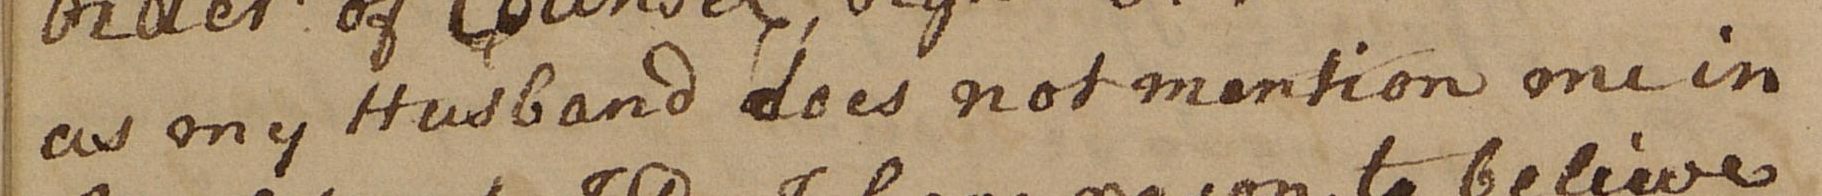as my Husband does not mention me in
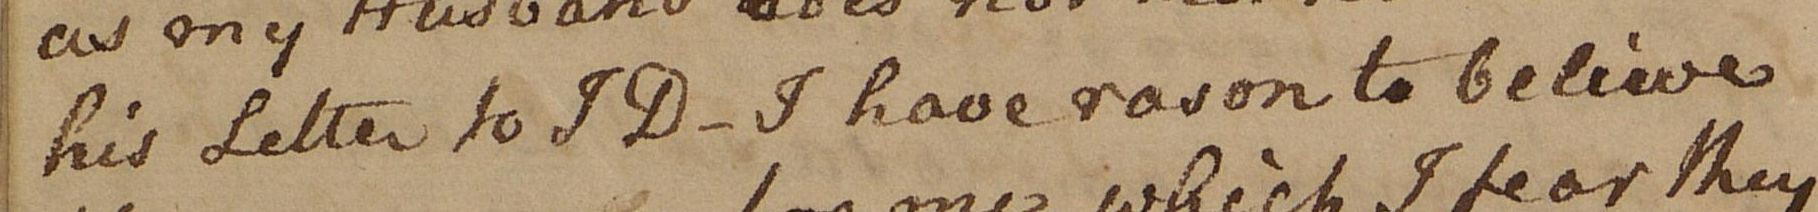his Letter to J D- I have rason to believe
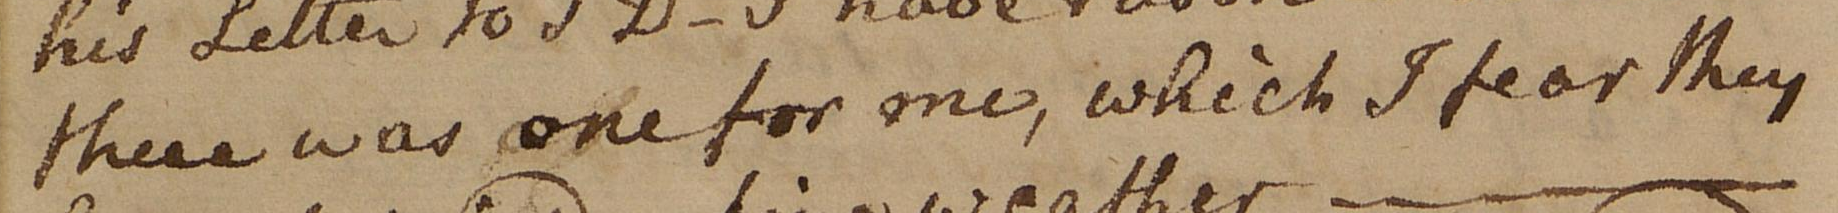there was one for me, which I fear they
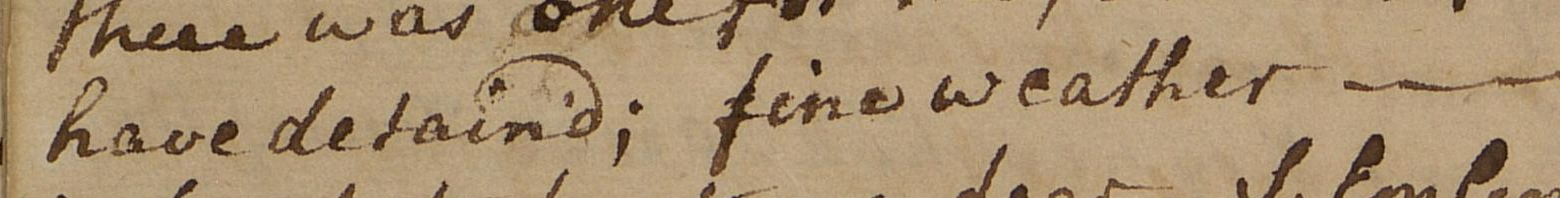have detain'd; fine weather-
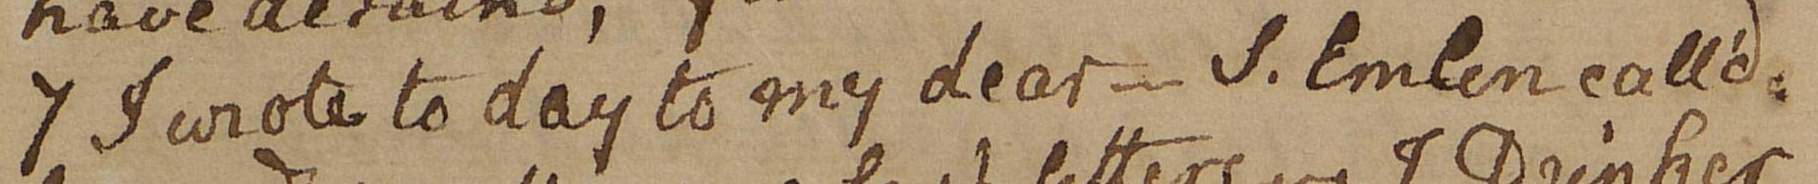7 I wrote to day to my dear- S. Emlen call'd
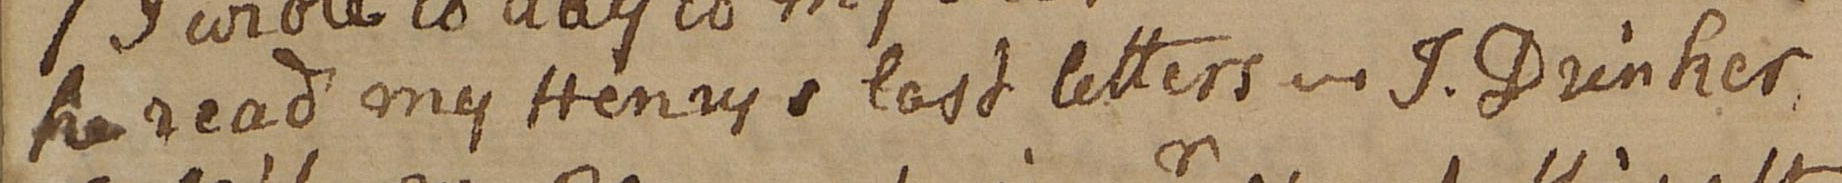he read my Henrys last letters- J. Drinker
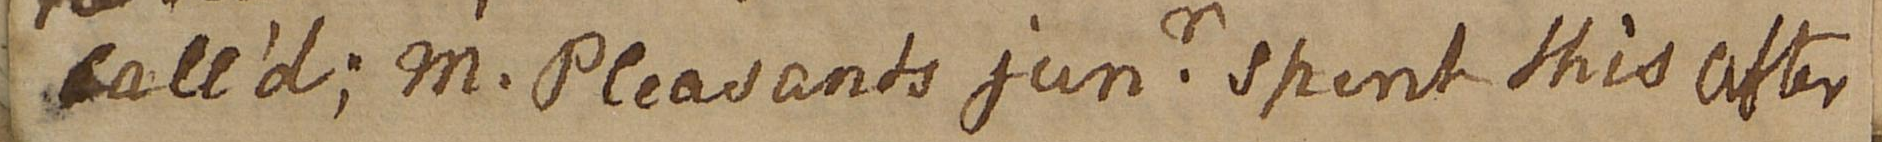call'd; M. Pleasants jun^r. spent this after
